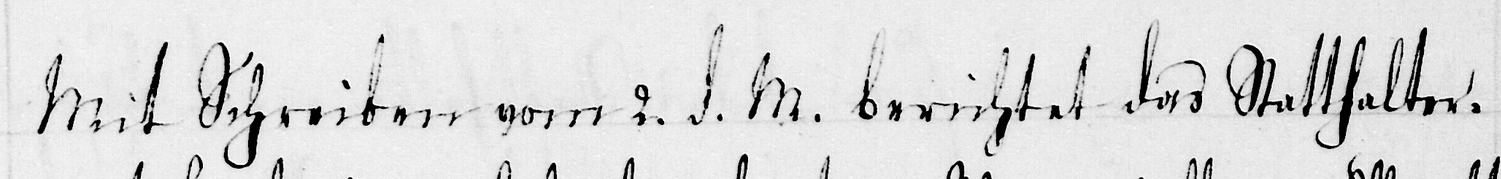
Mit Schreiben vom 2. d. M. berichtet das Statthalter¬
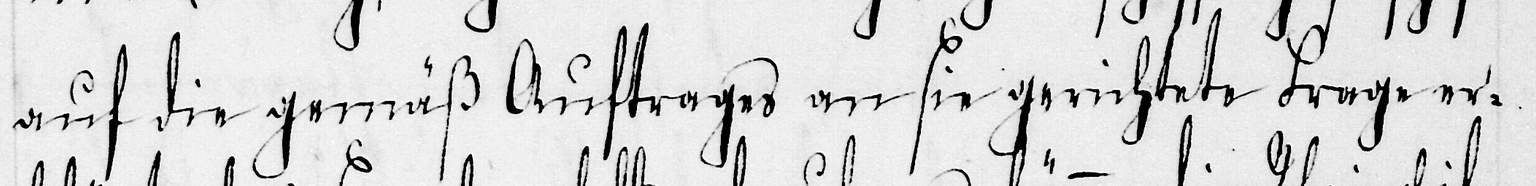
auf die gemäß Auftrages an sie gerichtete Frage er¬
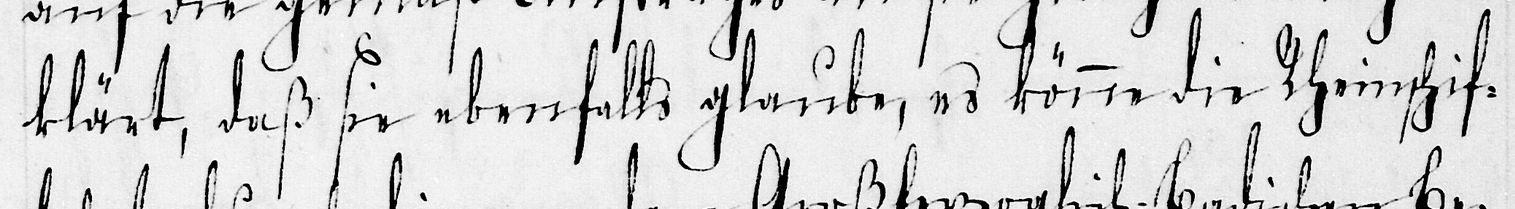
klärt, daß sie ebenfalls glaube, es könne die Rheinschif¬
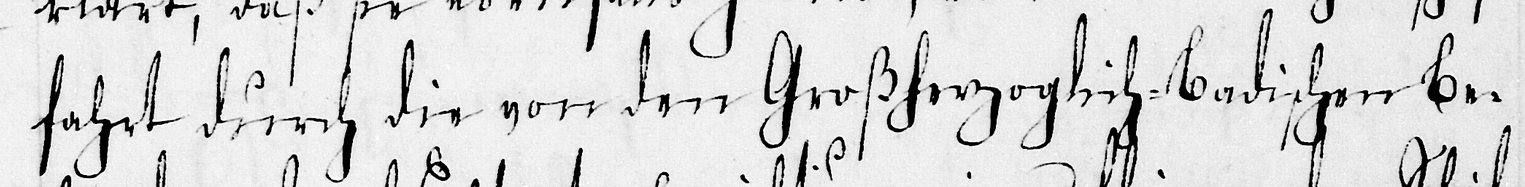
fahrt durch die von den Großherzoglich-Badischen Be¬
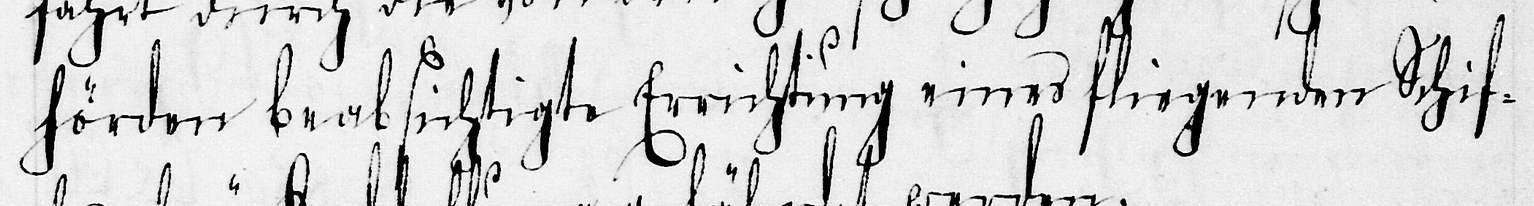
hörden beabsichtigte Errichtung eines fliegenden Schif¬
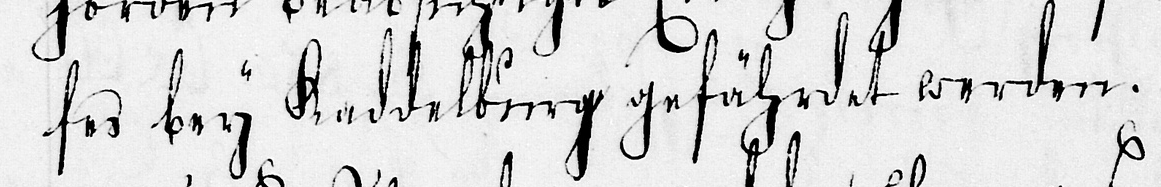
fes bey Kaddelburg gefährdet werden.
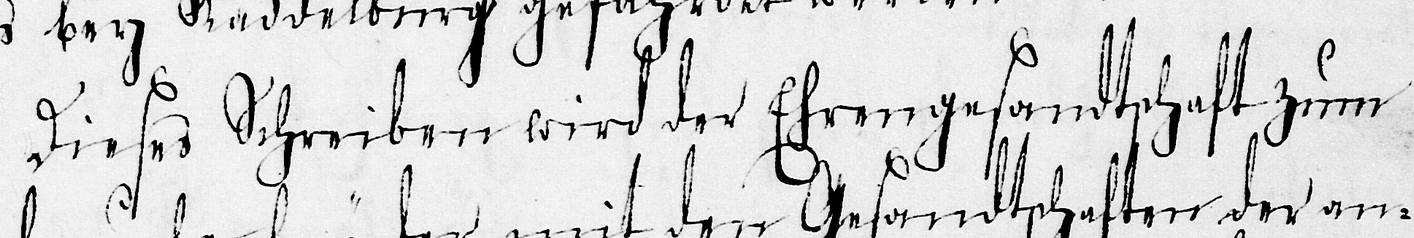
Dieses Schreiben wird der Ehrengesandtschaft zum
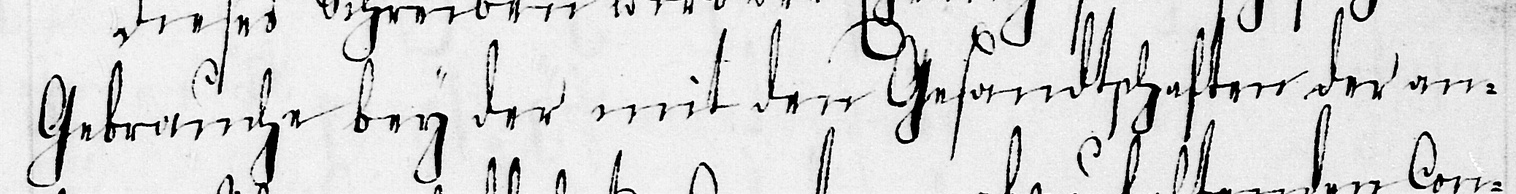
Gebrauche bey der mit den Gesandtschaften der an¬
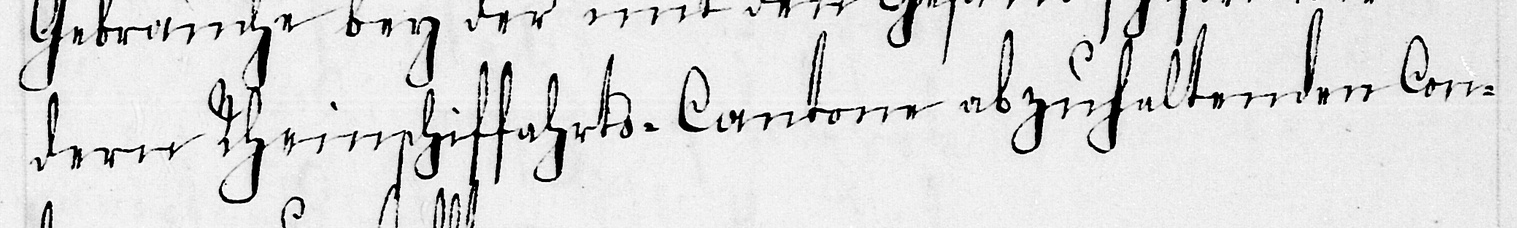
dern Rheinschiffahrts-Cantone abzuhaltenden Con¬
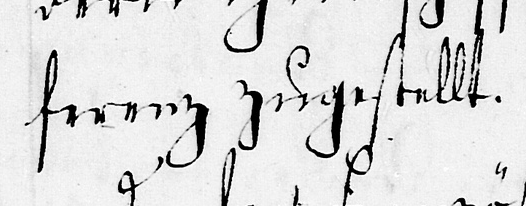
ferenz zugestellt.
